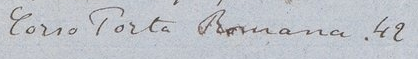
Corso Porta Romana. 42
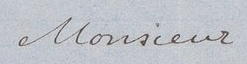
Monsieur
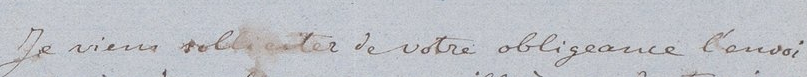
Je viens solliciter de votre obligeance l'envoi
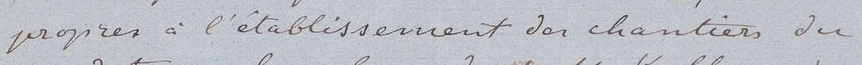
propres à l'établissement des chantiers du
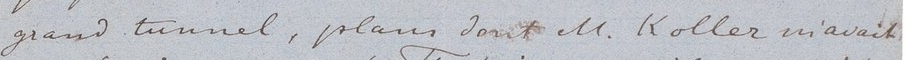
grand tunnel, plans dont M. Koller m'avait
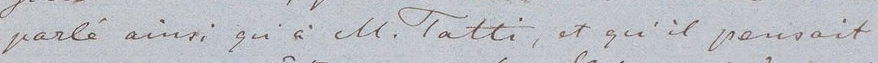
parlé ainsi qu'à M. Tatti, et qu'il pensait
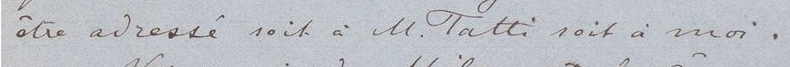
être adressé soit à M. Tatti soit à moi.
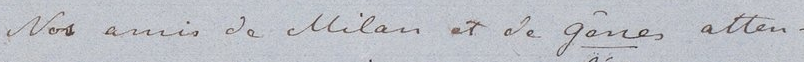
Nos amis de Milan et de Gênes atten-
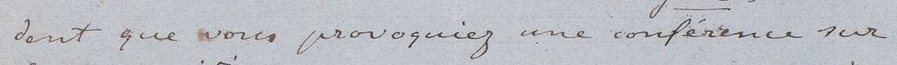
dent que vous provoquiez une conférence sur
